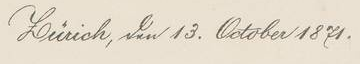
Zürich, den 13 October 1871.
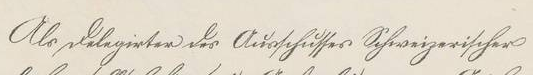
Als Delegirter des Ausschusses Schweizerischer
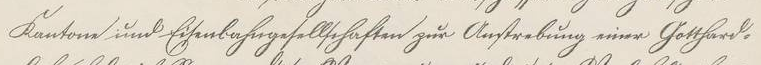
Kantone und Eisenbahngesellschaften zur Anstrebung einer Gotthard -
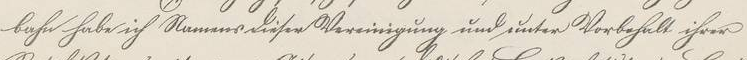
bahn habe ich Namens dieser Vereinigung und unter Vorbehalt ihrer
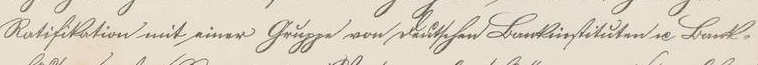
Ratifikation mit einer Gruppe von Deutschen Bankinstituten & Bank-
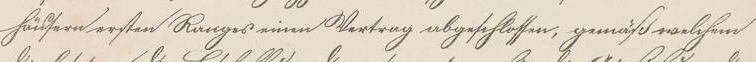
häusern ersten Ranges einen Vertrag abgeschlossen, gemäß welchem
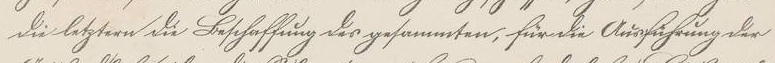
die letztern die Beschaffung des gesammten, für die Ausführung der
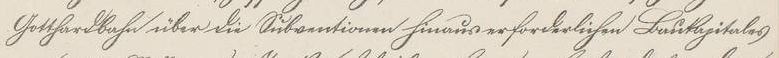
Gotthardbahn über die Subventionen hinaus erforderlichen Baukapitales
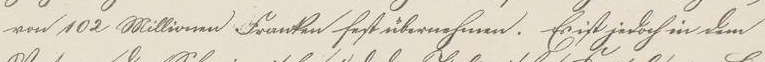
von 102 Millionen Franken fest übernehmen. Es ist jedoch in dem
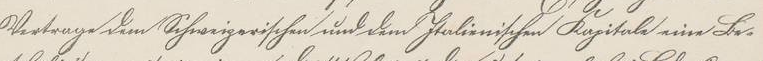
Vertrage dem Schweizerischen und dem Italienischen Kapitale eine Be-
